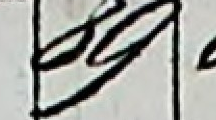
89
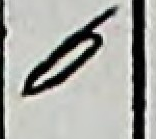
6
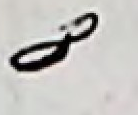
8
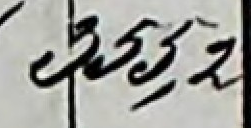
355,2
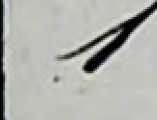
1
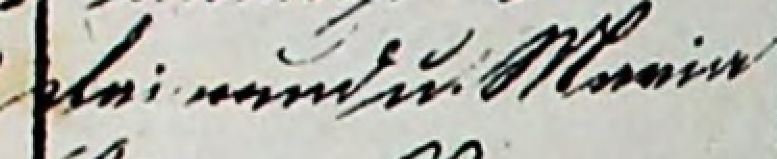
Reimund u. Maria
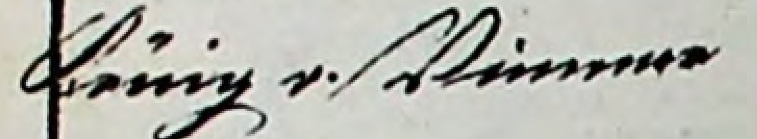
König v. Vimmer
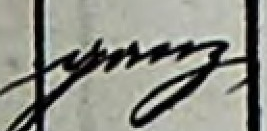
ganz
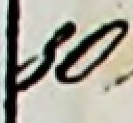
80
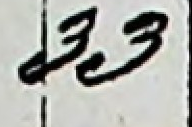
33
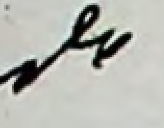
do
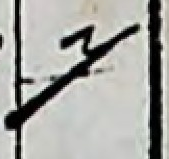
7
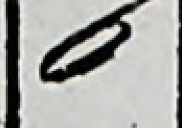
6
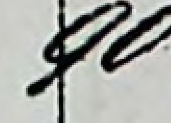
90
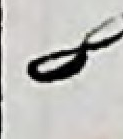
8
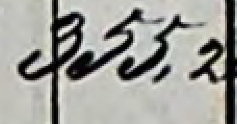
355,2
